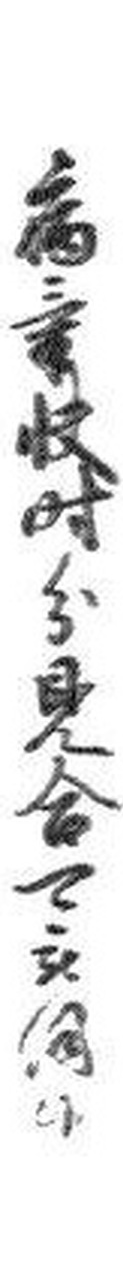病気快時分見合可被伺候
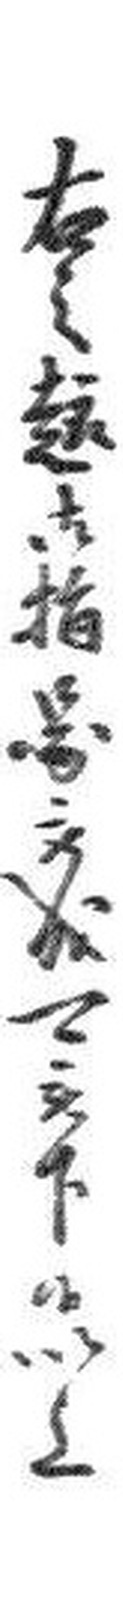右之趣御指図被成可被下候以上

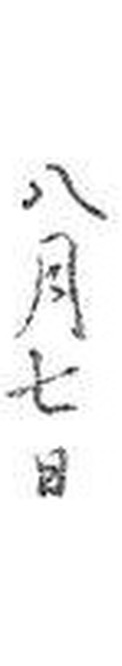八月七日
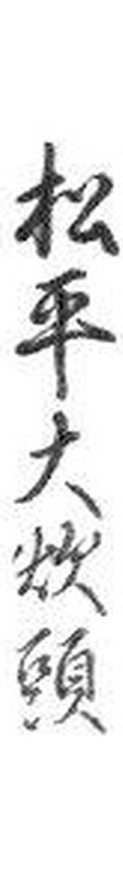松平大炊頭
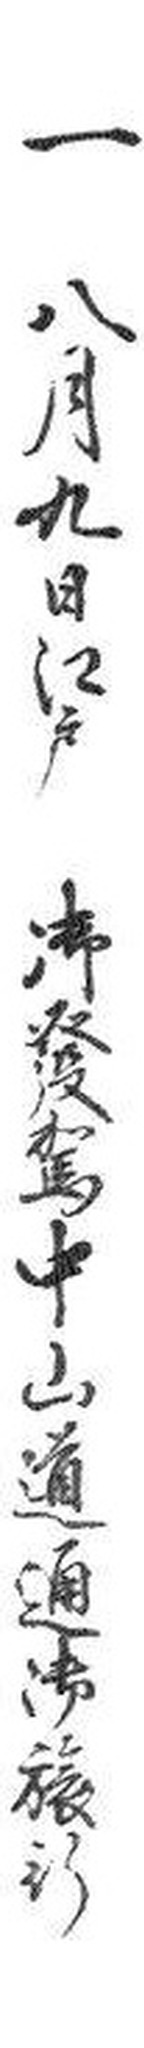一八月九日江戸御発駕中山道通御旅行
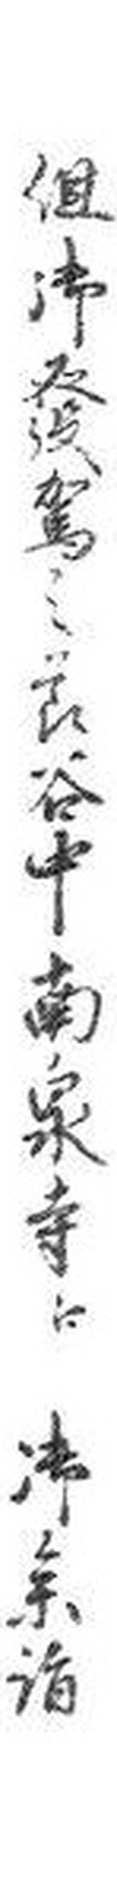但御発駕之節谷中南泉寺江御参詣
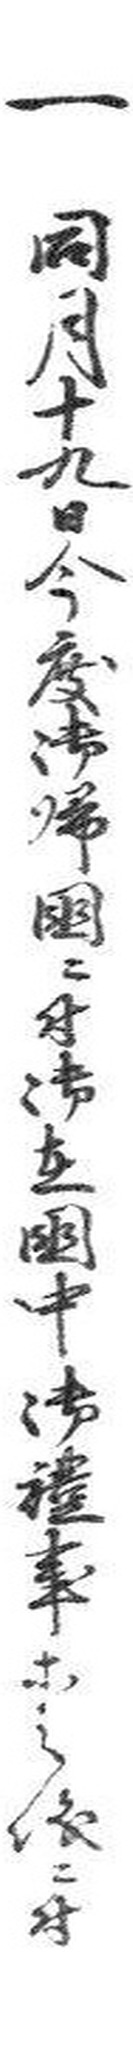一同月十九日今度御帰国二付御在国中御礼事等之儀ニ付
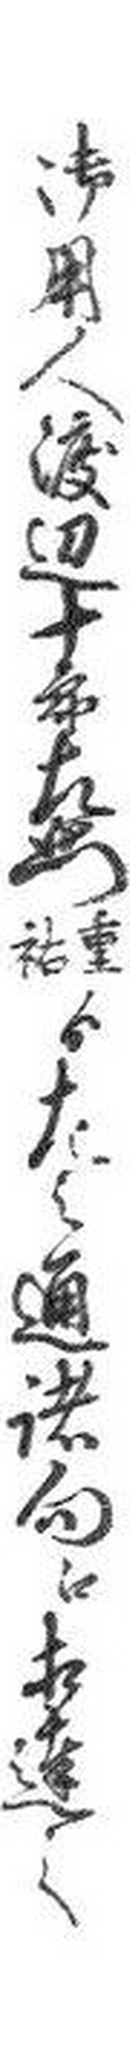御用人渡辺十郎左衛門重祐ゟ左之通諸向江相達之
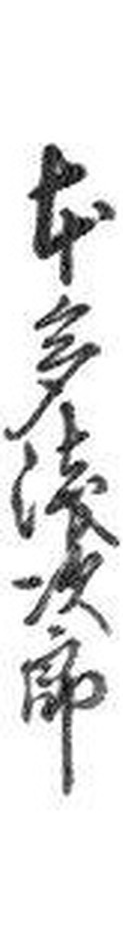本多浅次郎
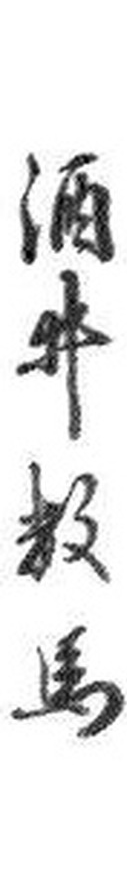酒井数馬
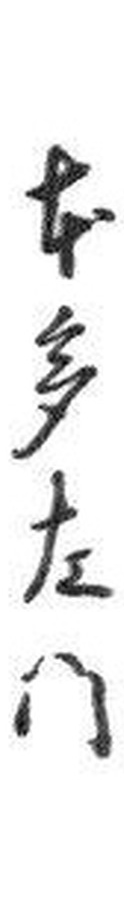本多左門
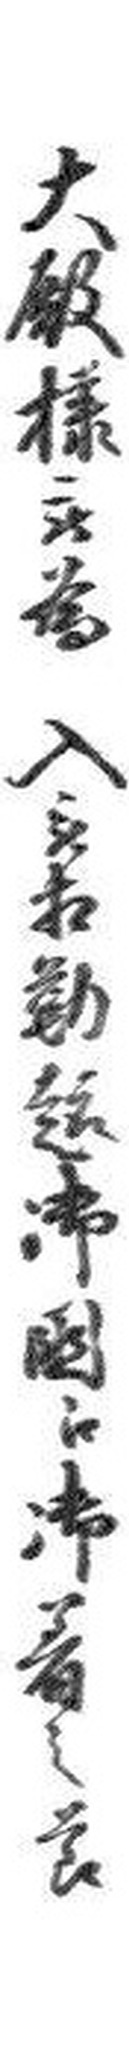大殿様被為入被相勤趣御国江御着之節
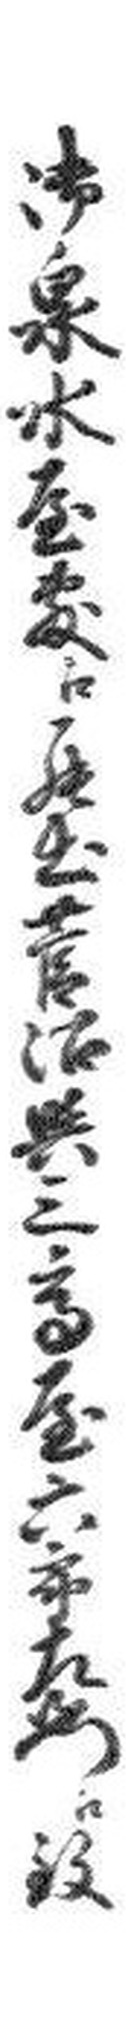御泉水屋敷江罷出菅沼与三高屋六郎左衛門江致
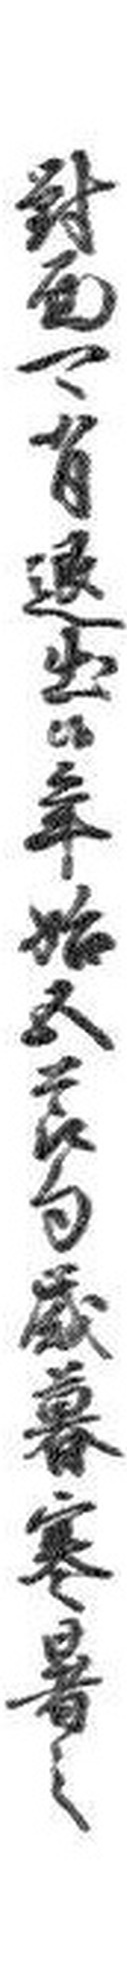対面可有退出候年始五節句歳暮寒暑之
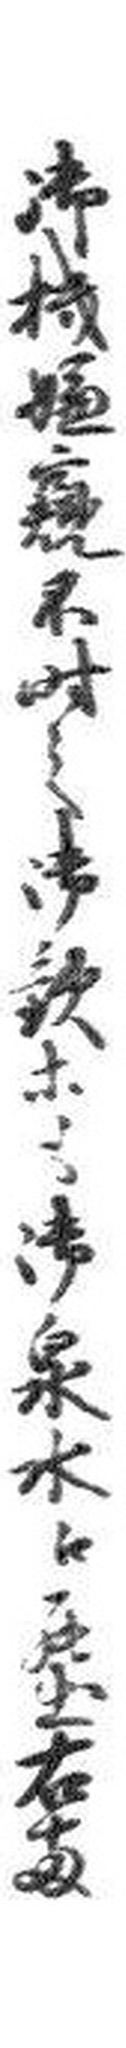御機嫌不時之御歓等も御泉水江罷出右両
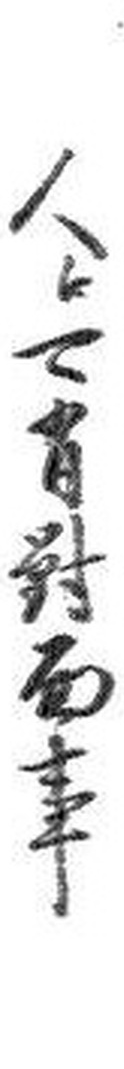人江可有対面事
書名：家譜 二十六 吉品公 従宝永七年到正徳二年
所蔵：福井県文書館 Fukui Prefectural Archives
